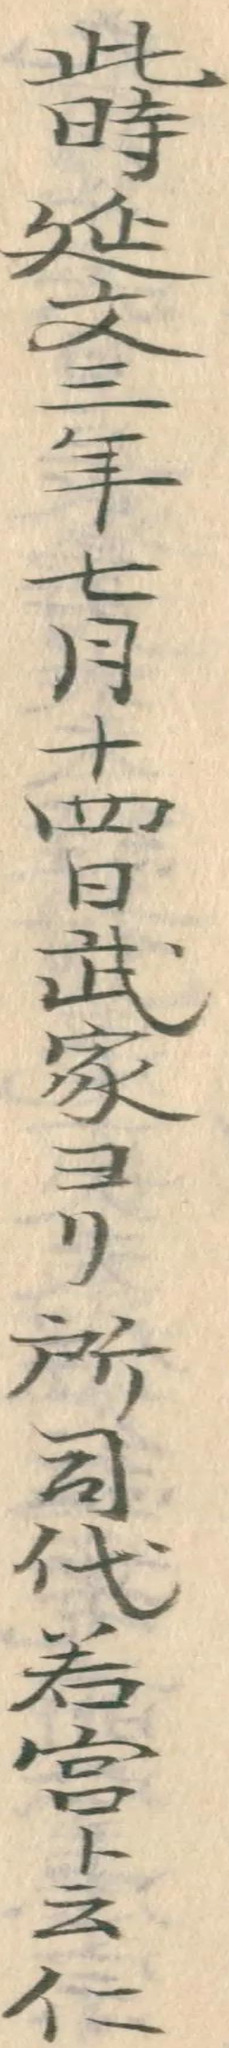此時延文三年七月十四日武家ヨリ所司代若宮ト云仁
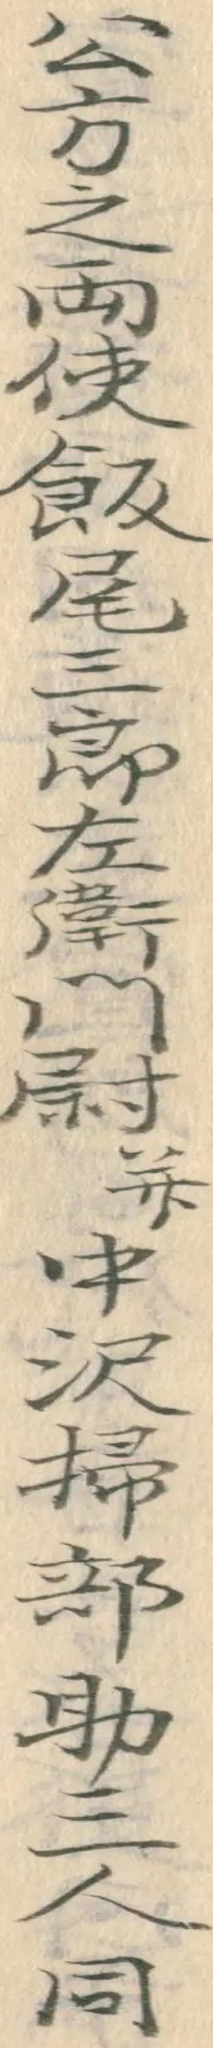公方之両使飯尾三郎左衛門尉并中沢掃部助三人同
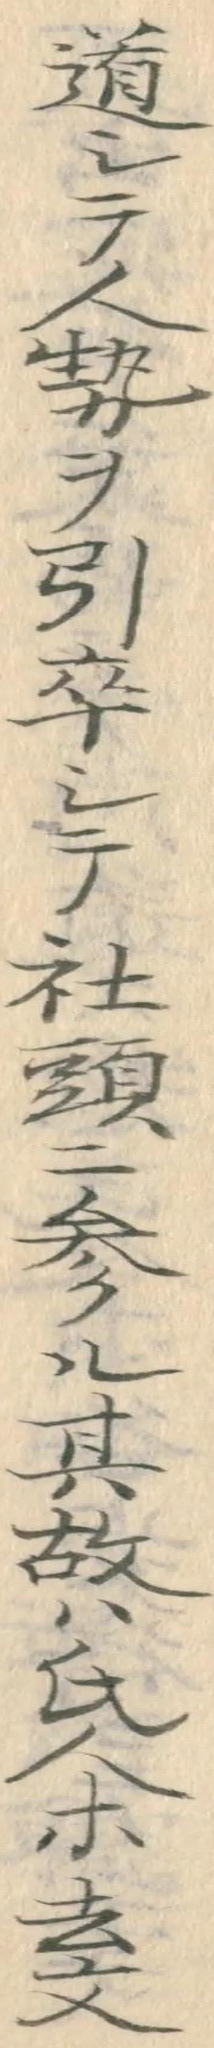道シテ人勢ヲ引卒シテ社頭ニ参ル其故ハ氏人等去文
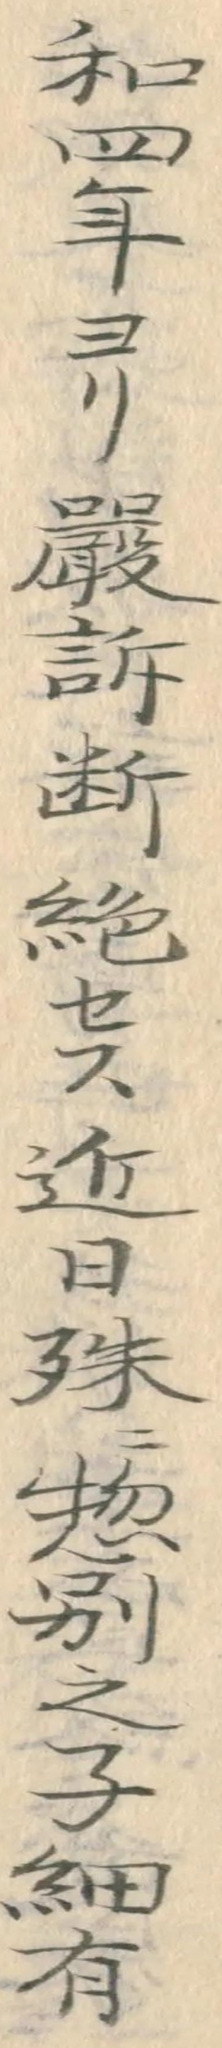和四年ヨリ厳訴断絶セス近日殊ニ惣別之子細有
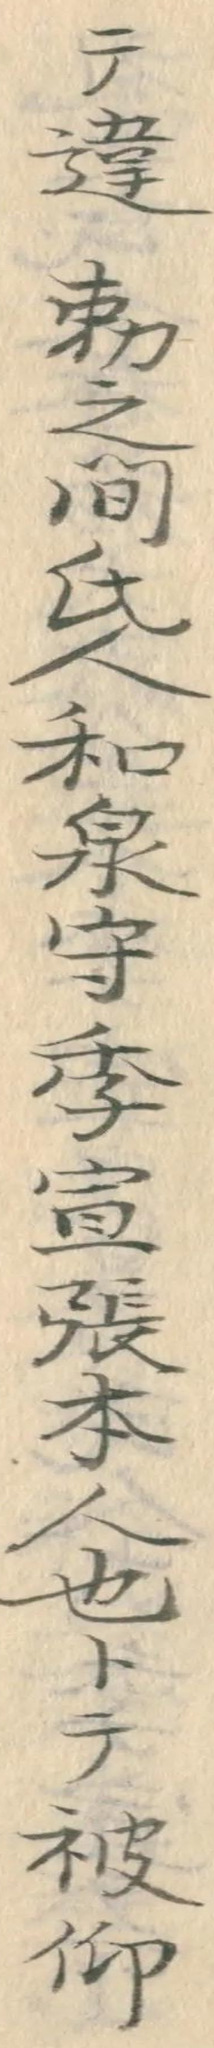テ違勅之間氏人和泉守季宣張本人也トテ被仰
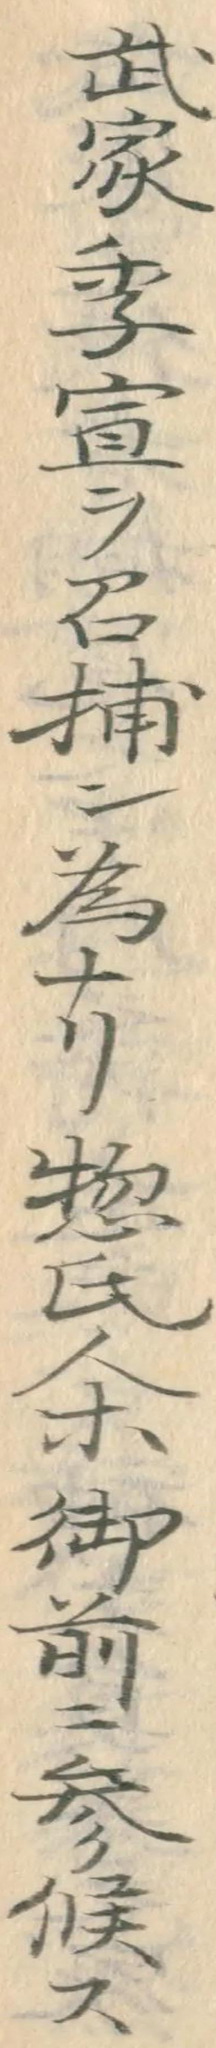武家季宣ヲ召捕ン為ナリ惣氏人等御前ニ参候ス

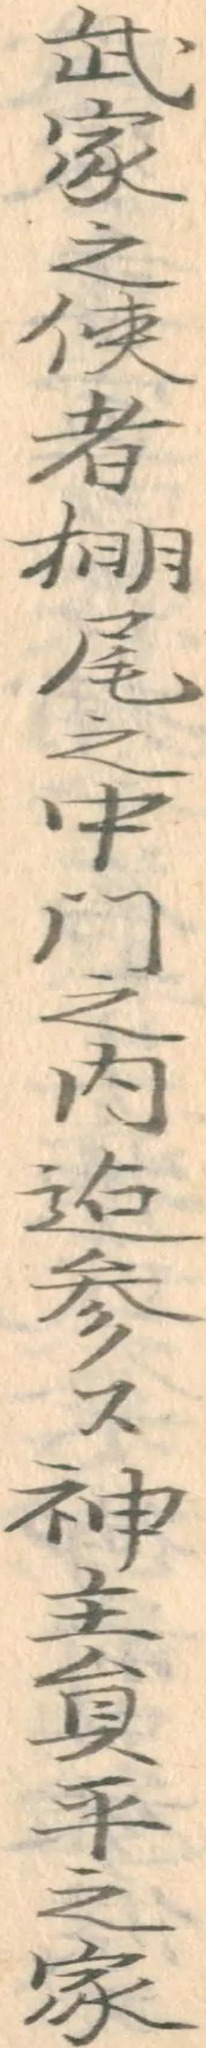武家之使者棚尾之中門之内迄参ス神主員平之家
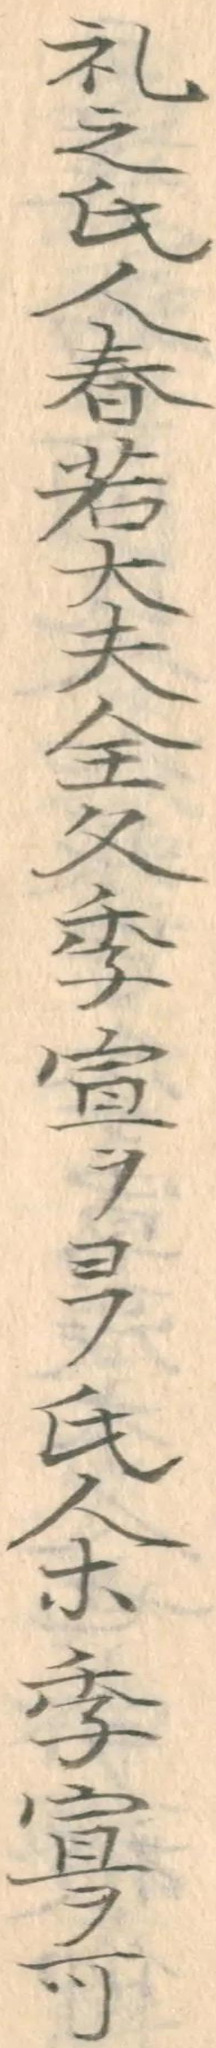礼之氏人春若大夫全久季宣ヲヨフ氏人等季宣ヲ可
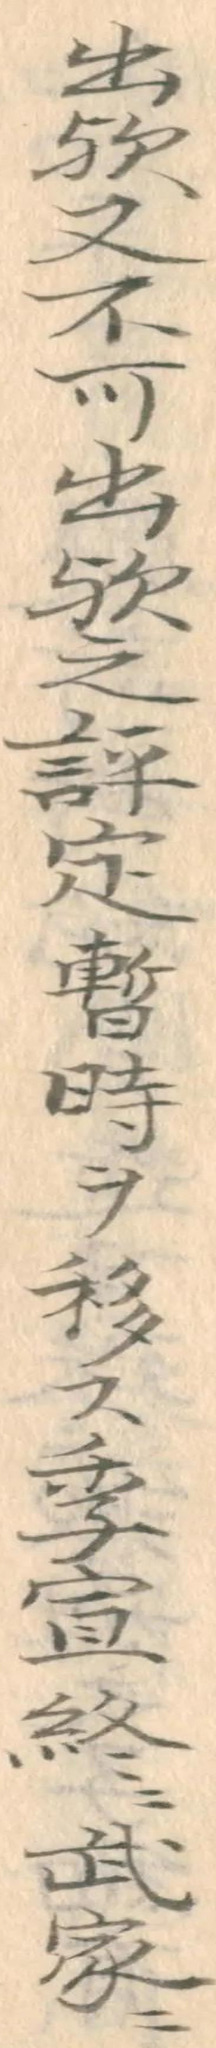出歟又不可出歟之評定暫時ヲ移ス季宣終ニ武家ニ
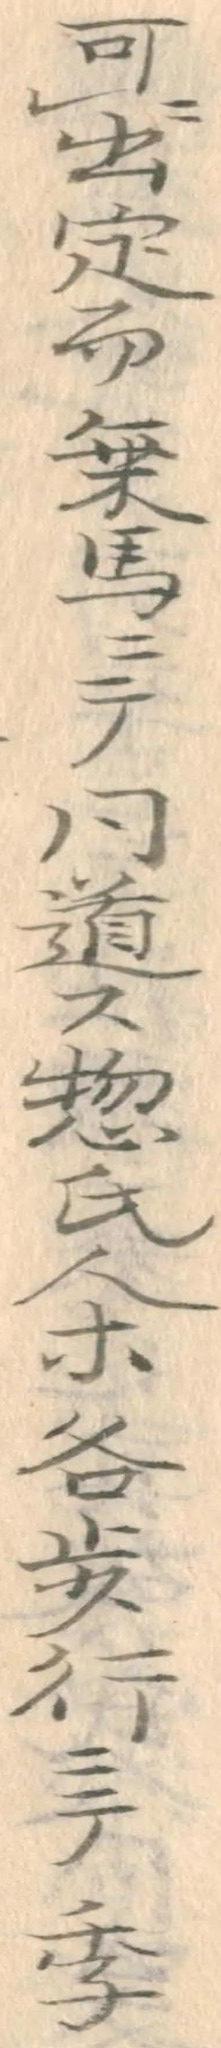可ニ出定而乗馬ニテ同道ス惣氏人等各歩行ニテ季
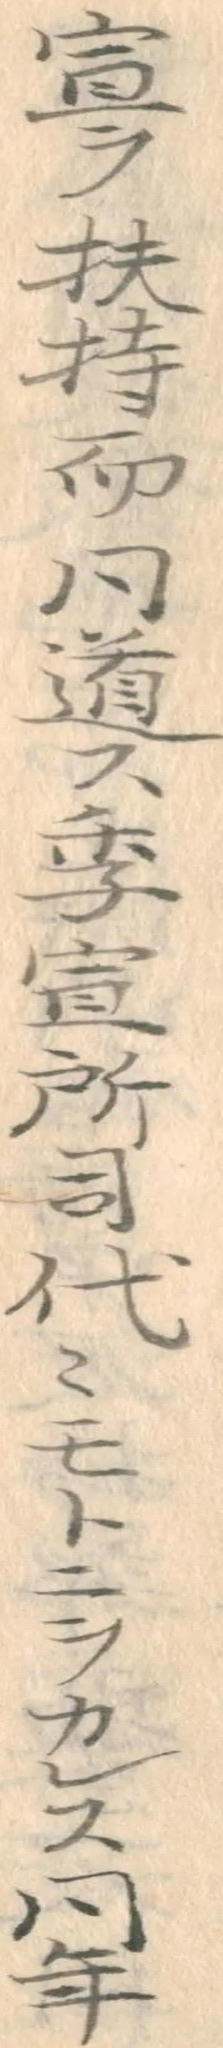宣ヲ扶持而同道ス季宣所司代々モトニヲカレス同年
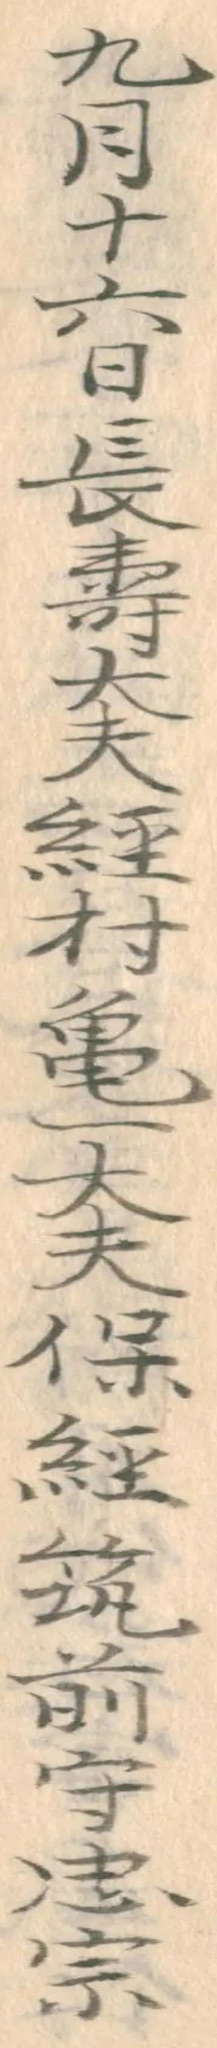九月十六日長寿大夫経村亀一大夫保経筑前守忠宗
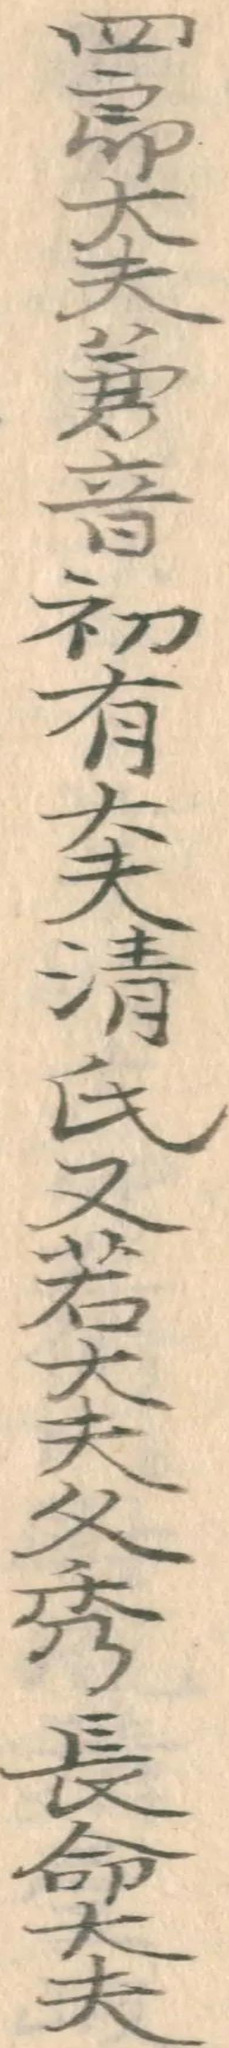四郎大夫兼音初有大夫清氏又若大夫久秀長命大夫
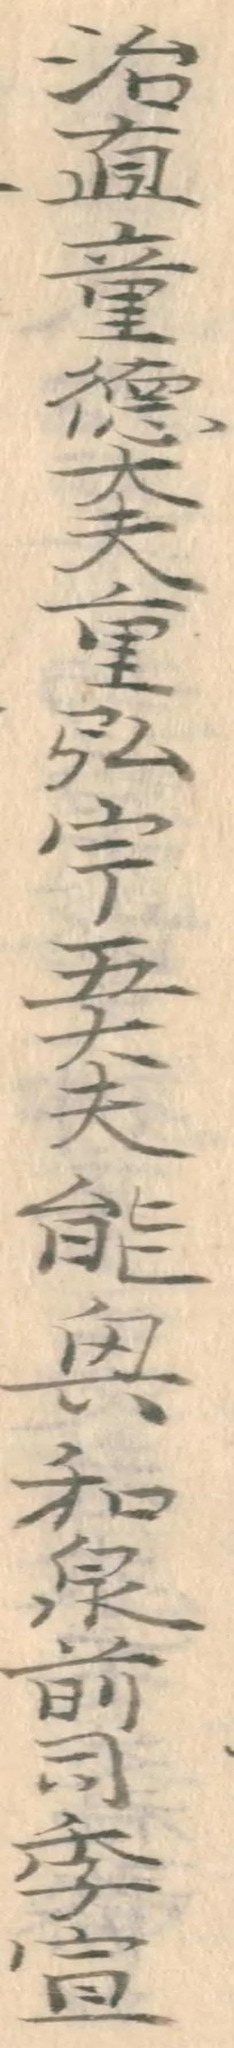治直童徳大夫重弘宇五大夫能興和泉前司季宣
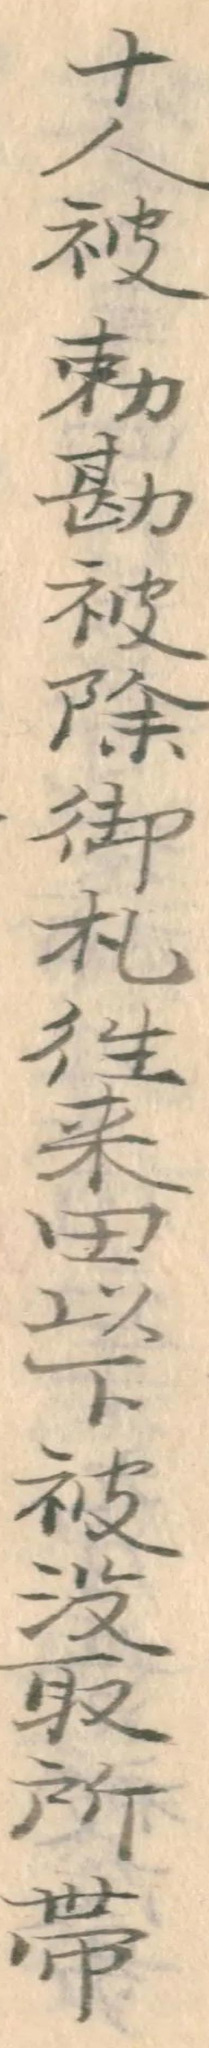十人被勅勘被除御札往来田以下被没取所帯
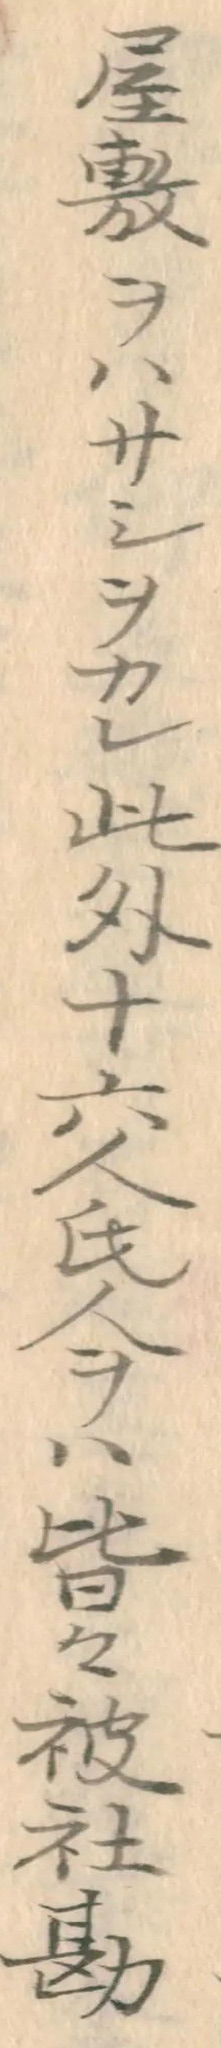屋敷ヲハサシヲカレ此外十六人氏人ヲハ皆々被社勘
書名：賀茂社記録. 第24冊
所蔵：国立国会図書館 National Diet Library, JAPAN
